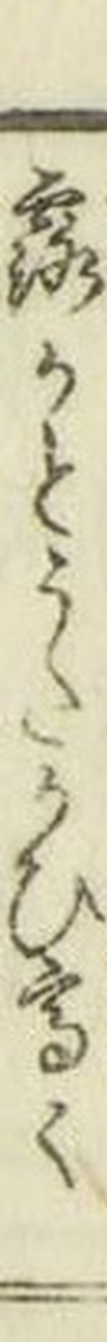露かとうたかひ高く
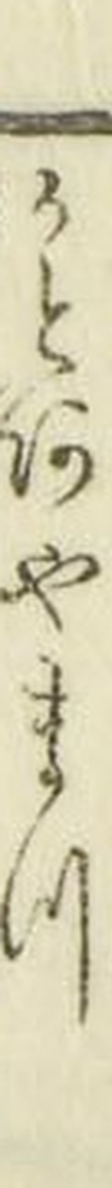かとあやまつ
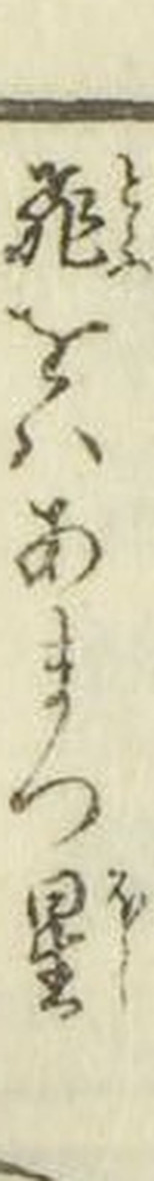飛をはあまつ星
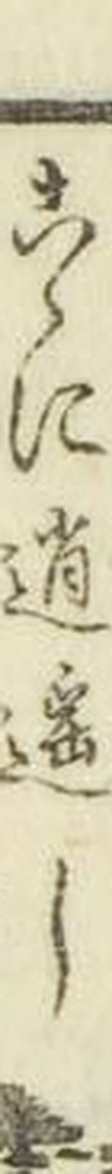こゝに逍遥し
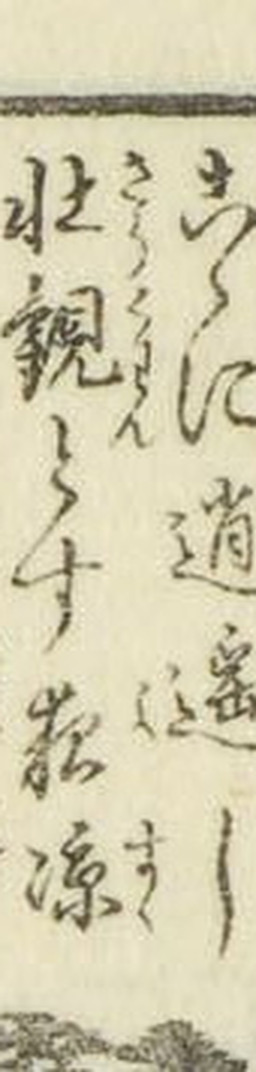壮観とす夜凉
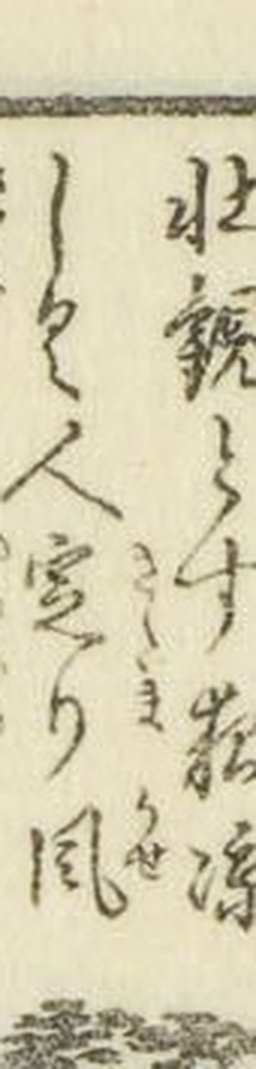しく人定り風
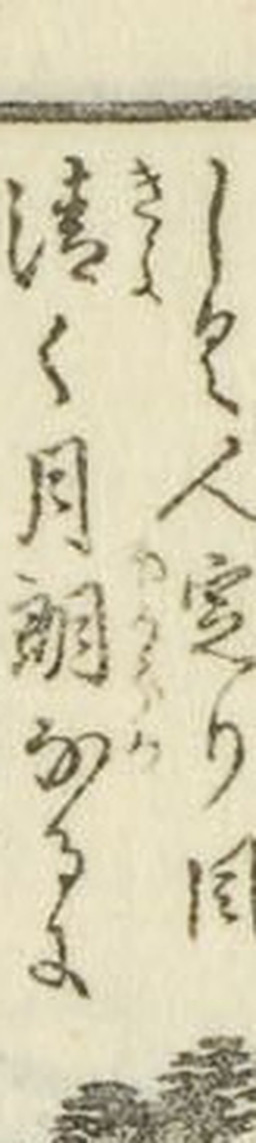清く月朗なるに
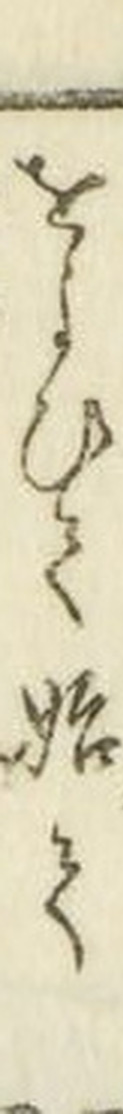をよひて始て
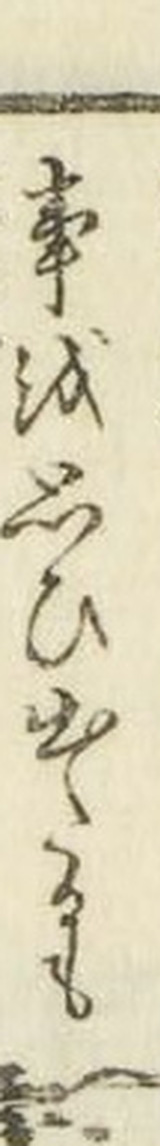事を思ひ出たるも
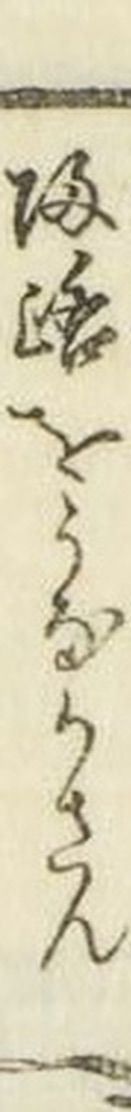帰路をうなかさん
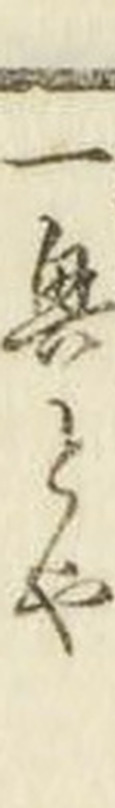一興とや
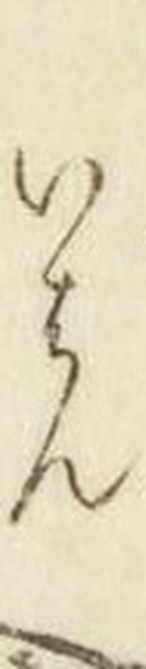いはん
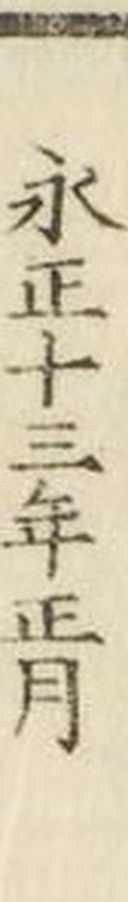永正十三年正月
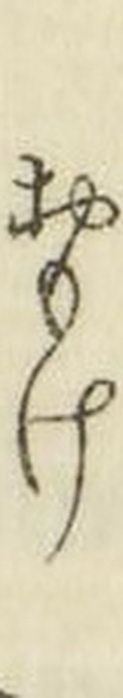おもけ
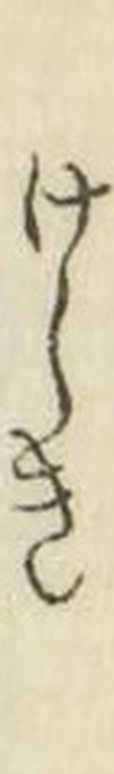けしき

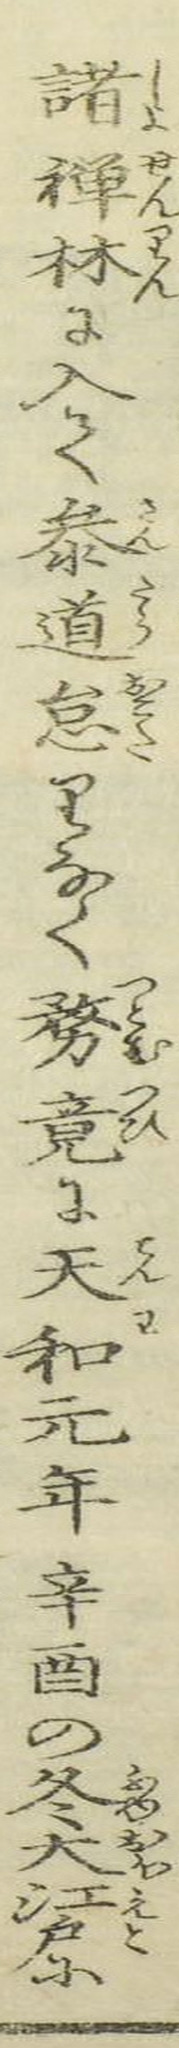諸禅林に入て参道怠りなく務竟に天和元年辛酉の冬大江戸に
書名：江戸名所図会 20巻 巻之12
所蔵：東京学芸大学教育コンテンツアーカイブ
